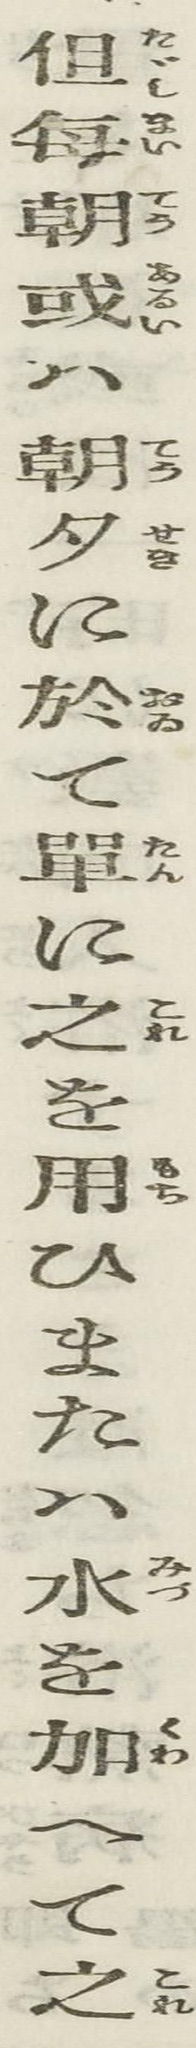但毎朝或は朝夕に於て単に之を用ひまたは水を加へて之
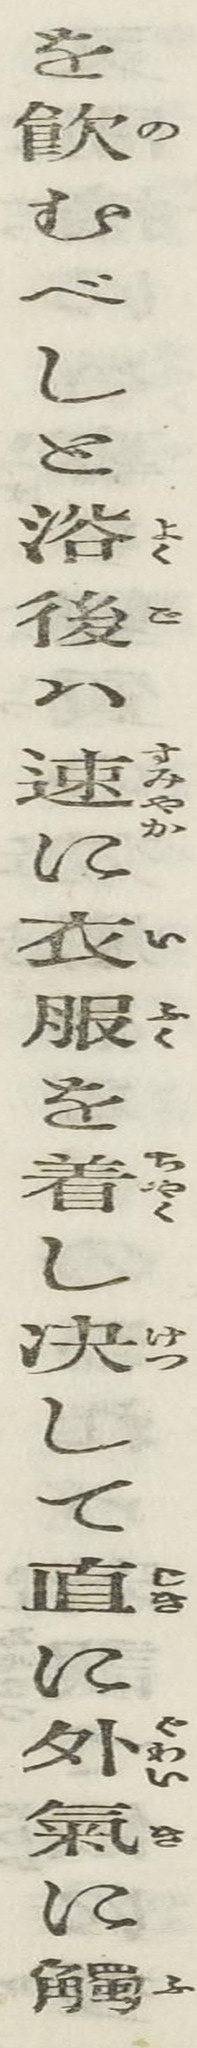を飲むべしと浴後は速に衣服を着し決して直に外氣に觸
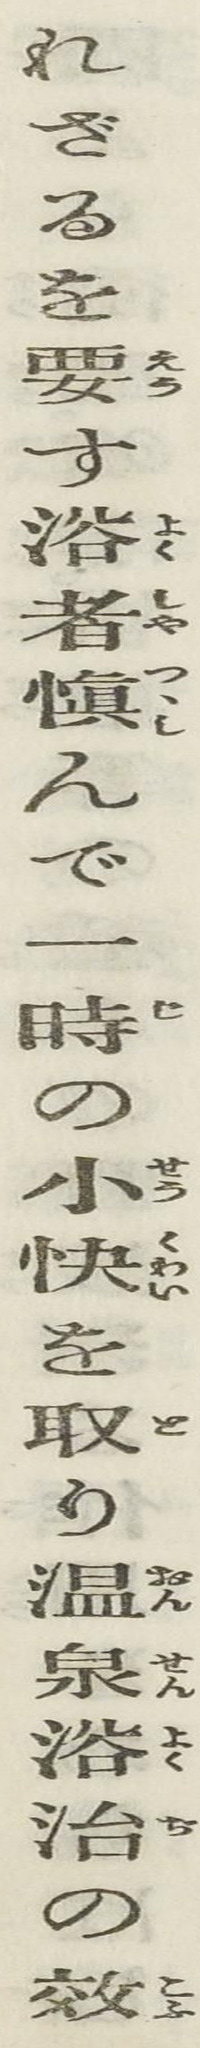れざるを要す浴者慎んで一時の小快を取り温度浴治の効
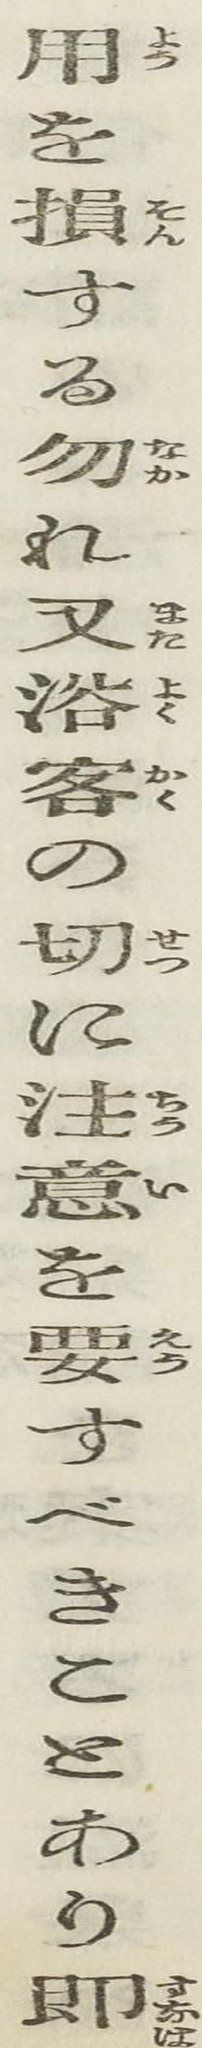用を損する勿れ又浴客の切に注意を要すべきことあり即

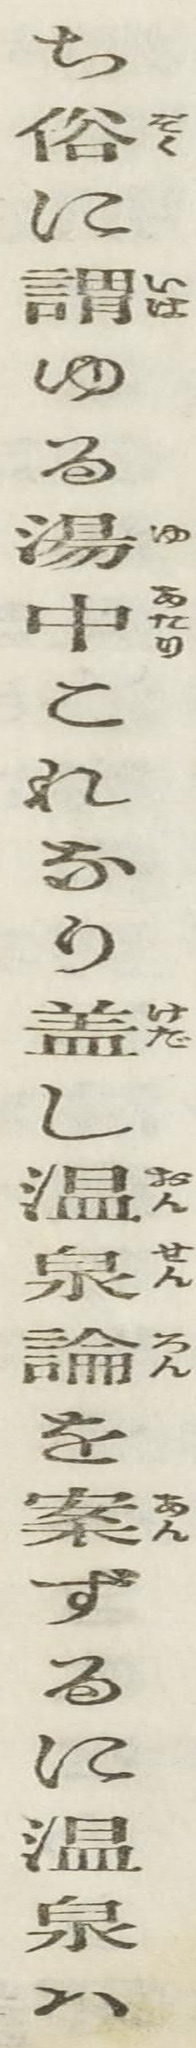ち俗に謂ゆる湯中これなり蓋し温泉論を案ずるに温泉は
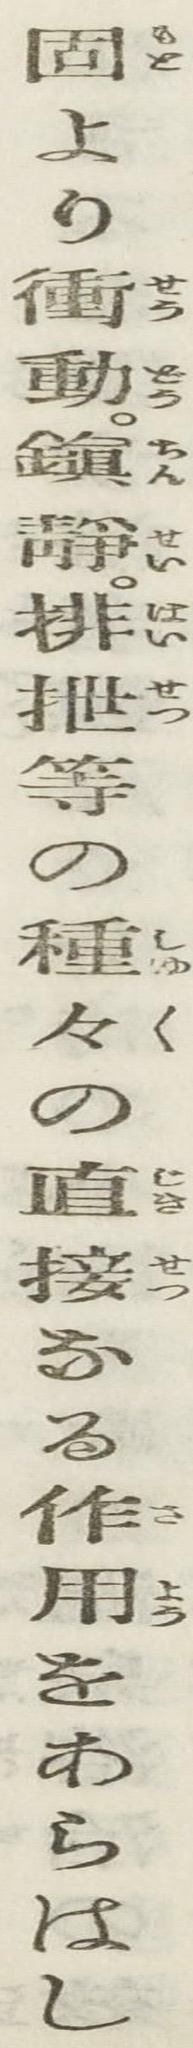固より衝動。鎮静。排泄等の種々の直接なる作用をあらはし
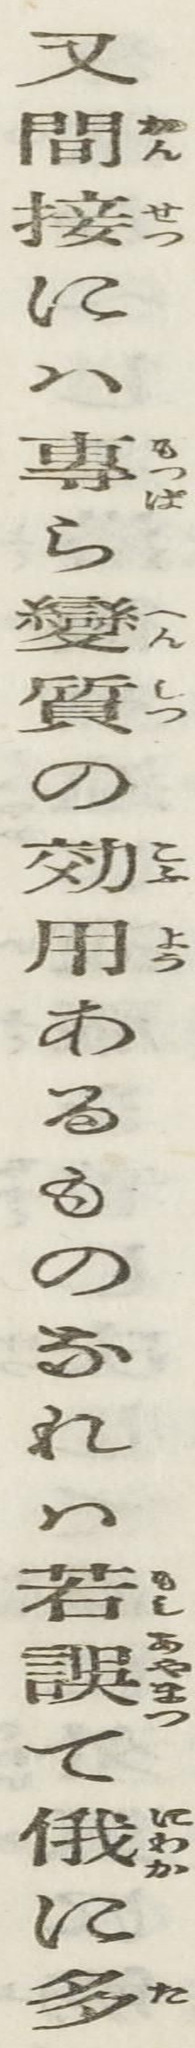又間接には専ら変質の効用あるもなれは若誤て俄に多
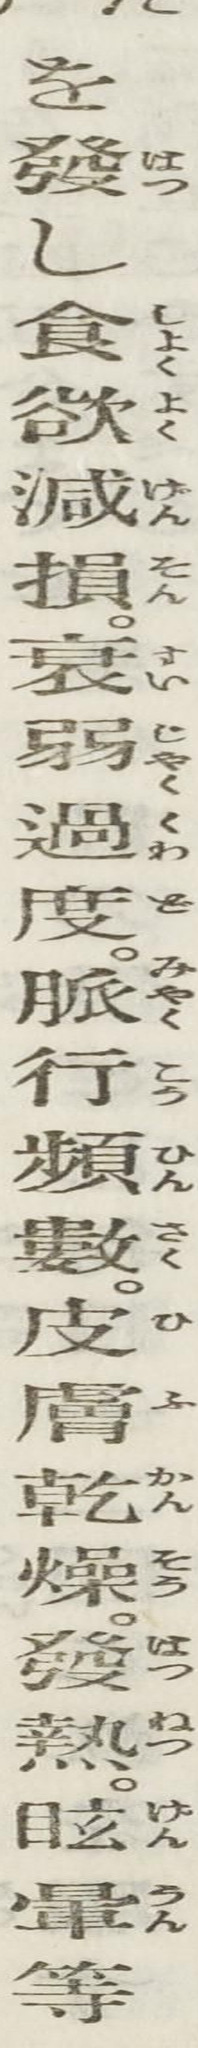たりを発し食欲減損。衰弱過度.。脈行頻数。皮膚乾燥。発熱。眩暈等
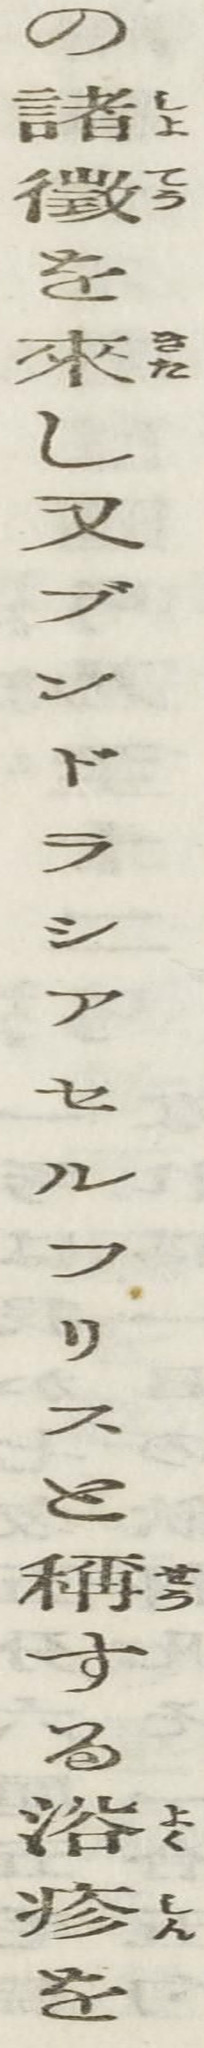の諸徴を来し又ブンドラシアセルフリスと称する浴疹を
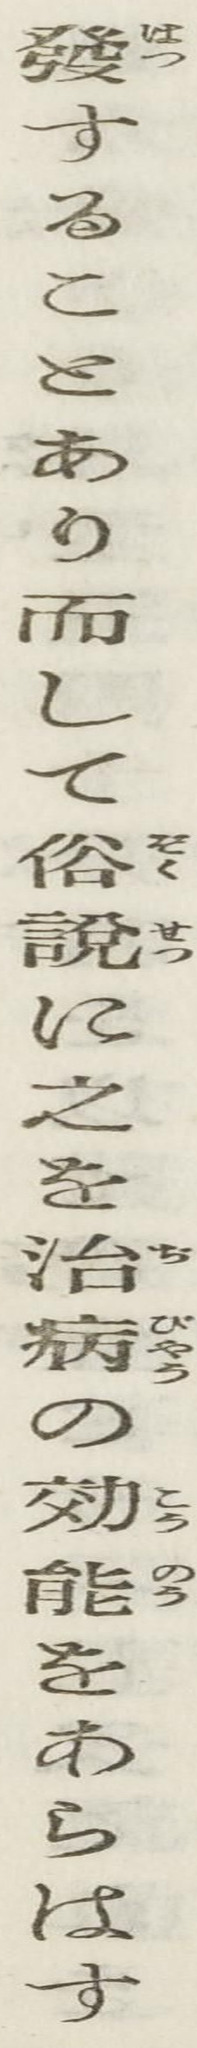発することあり而して俗説に之を治病の効能をあらはす
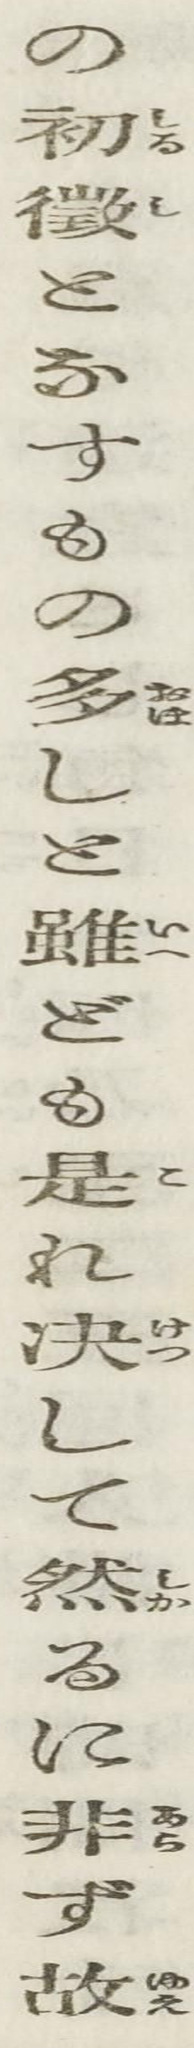の初徴となすもの多しと雖ども是れ決して然るに非ず故
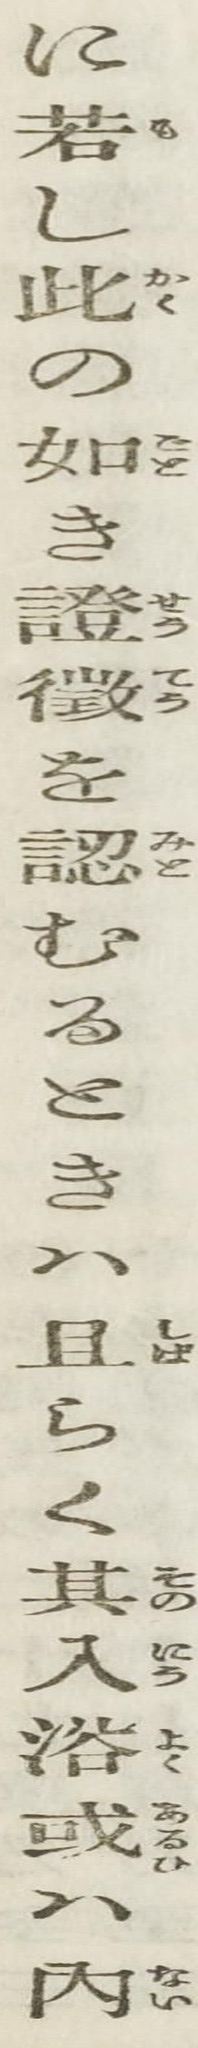に若し此の如き證徴を認むるときは且らく其入浴或は内
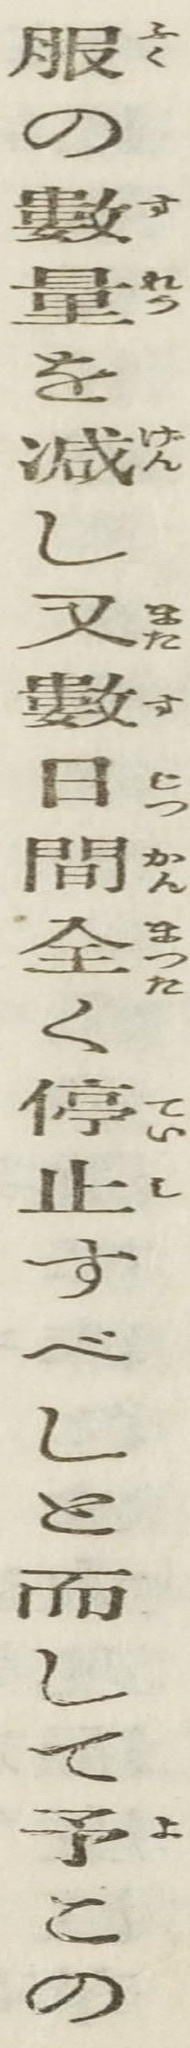服の数量を減し又数日間全く停止すべしと而して予この
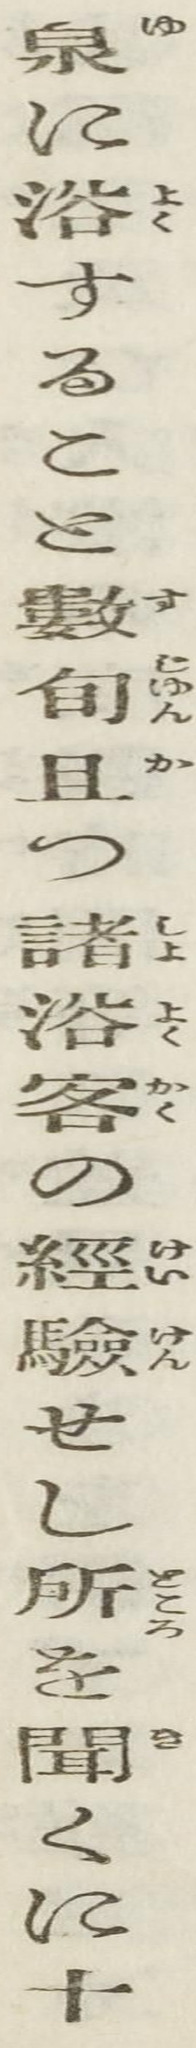泉に浴すること数旬且つ諸浴客の経験せし所を聞くに十
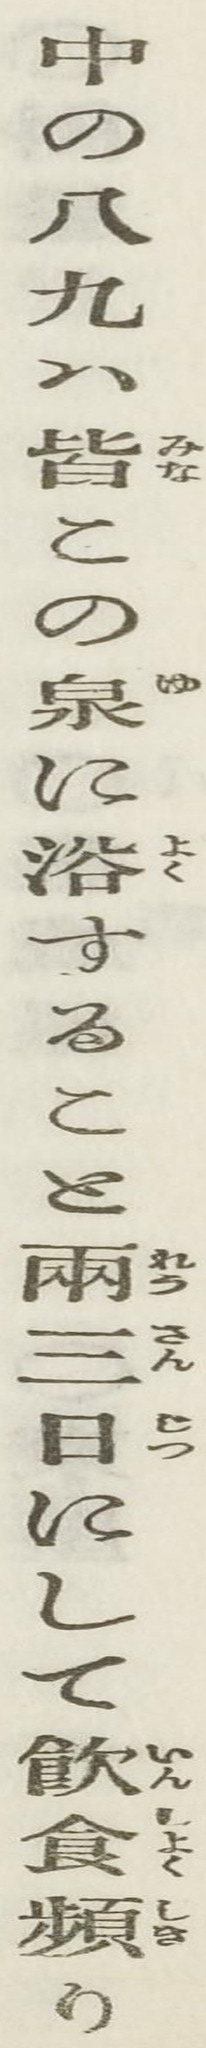中の八九は皆この泉に浴すること両三日にして飲食頻り
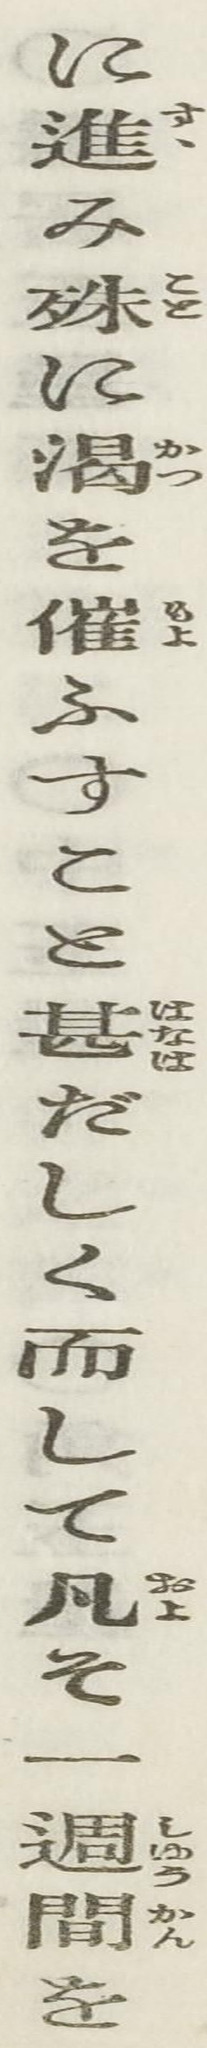に進み殊に渇を催ふすこと甚だしく而して凡そ一週間を
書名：熱海獨案内　全
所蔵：東京大学地震研究所図書室 Earthquake Research Institute Library, The University of Tokyo, JAPAN
